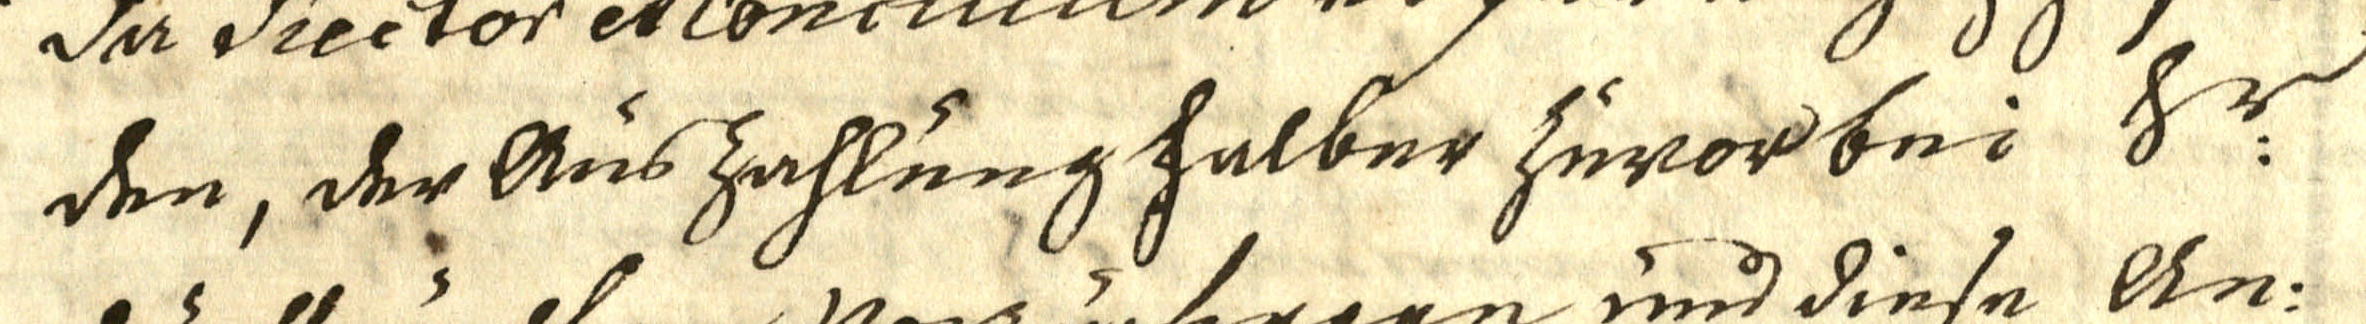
den, der Auszahlung halber zuvor bei Sr
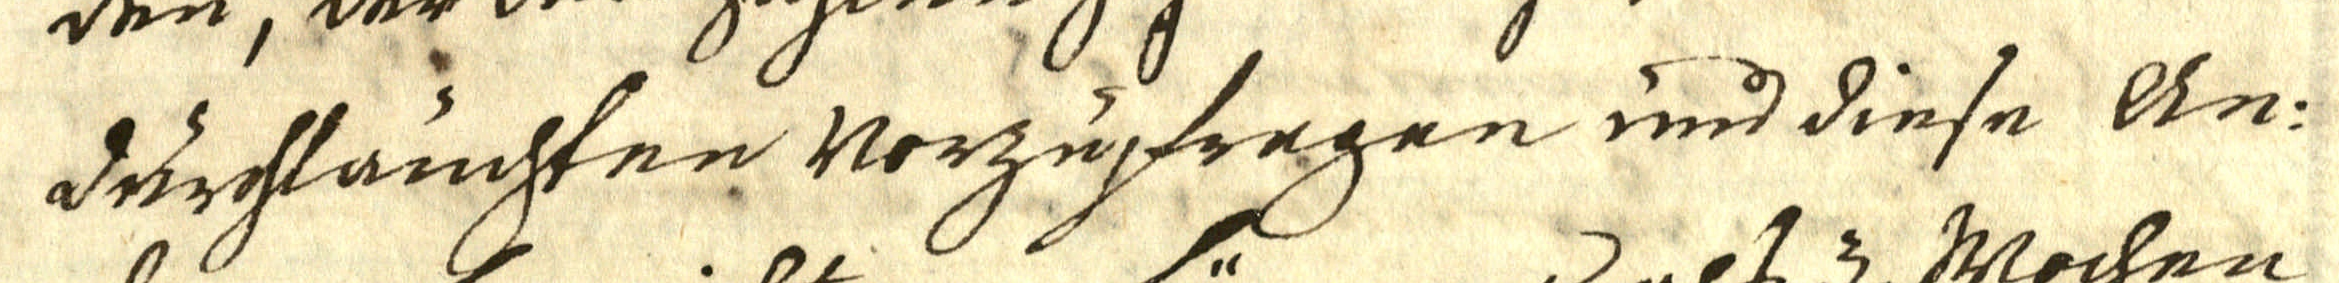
Durchlauchten vorzufragen und diese An¬
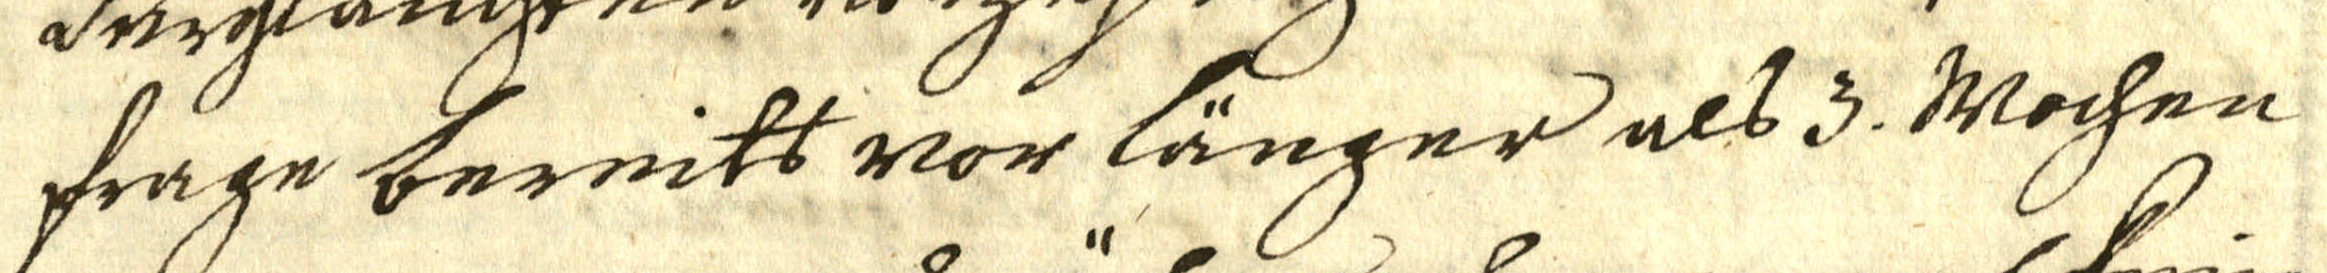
frage bereits vor länger als 3. Wochen
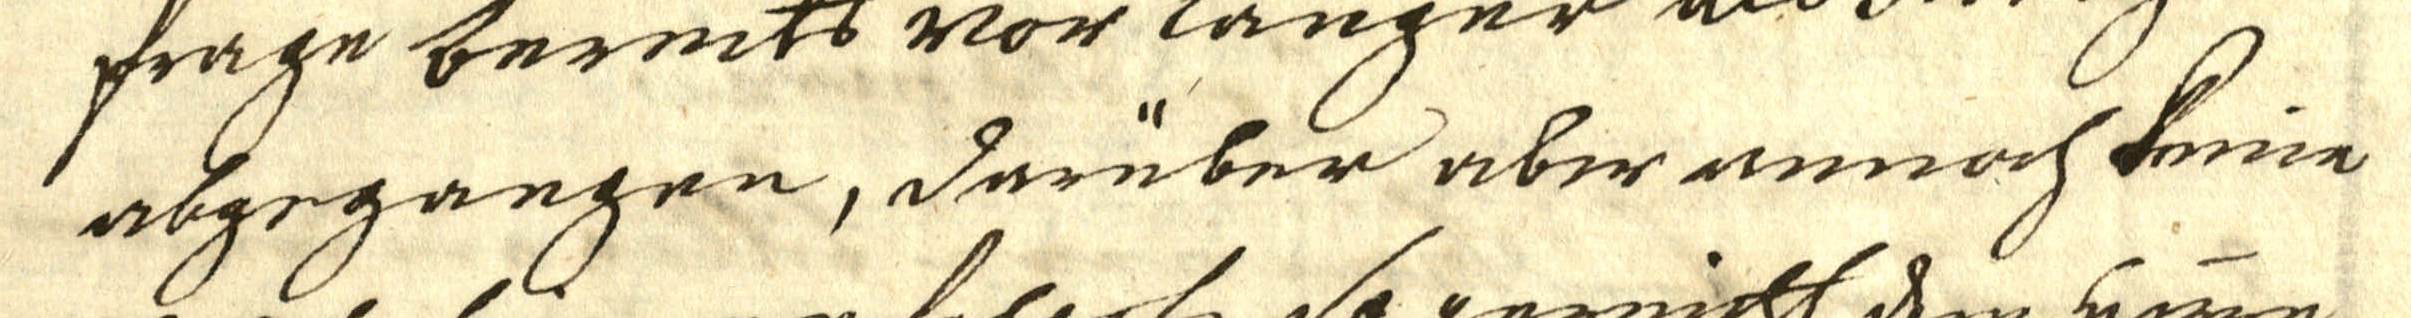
abgegangen, darüber aber annoch keine
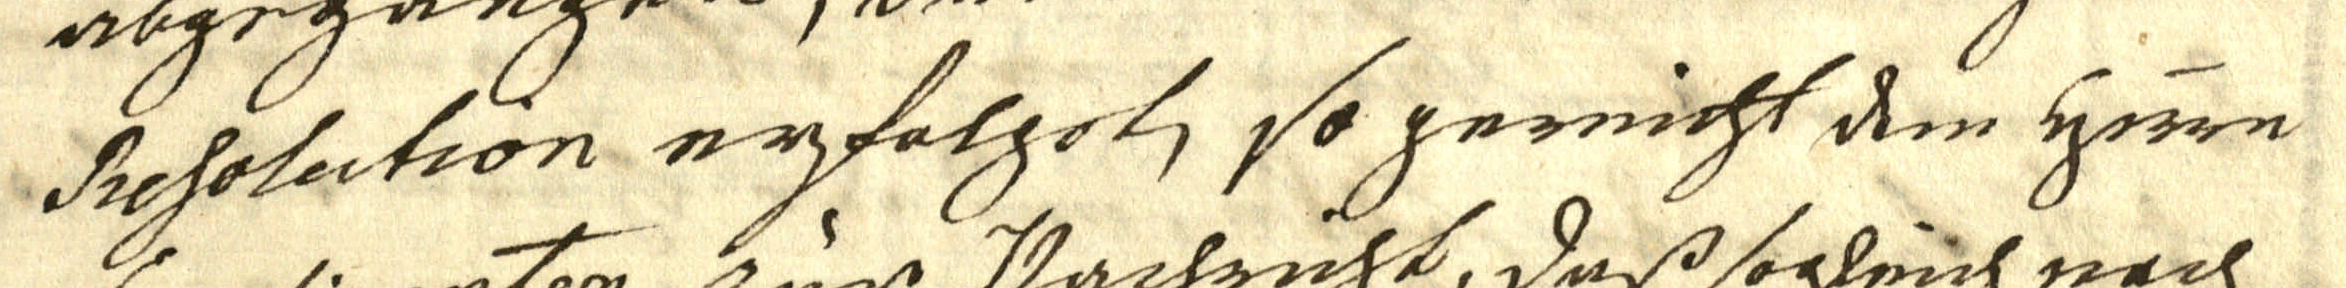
Resolution erfolget, so gereicht dem Herrn
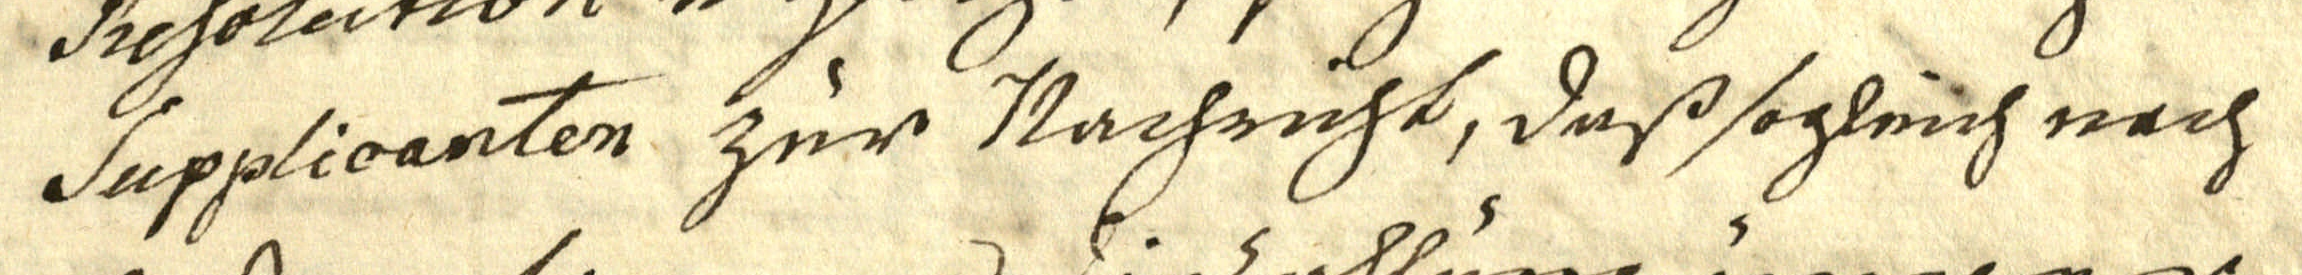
Supplicanten zur Nachricht, daß sogleich nach
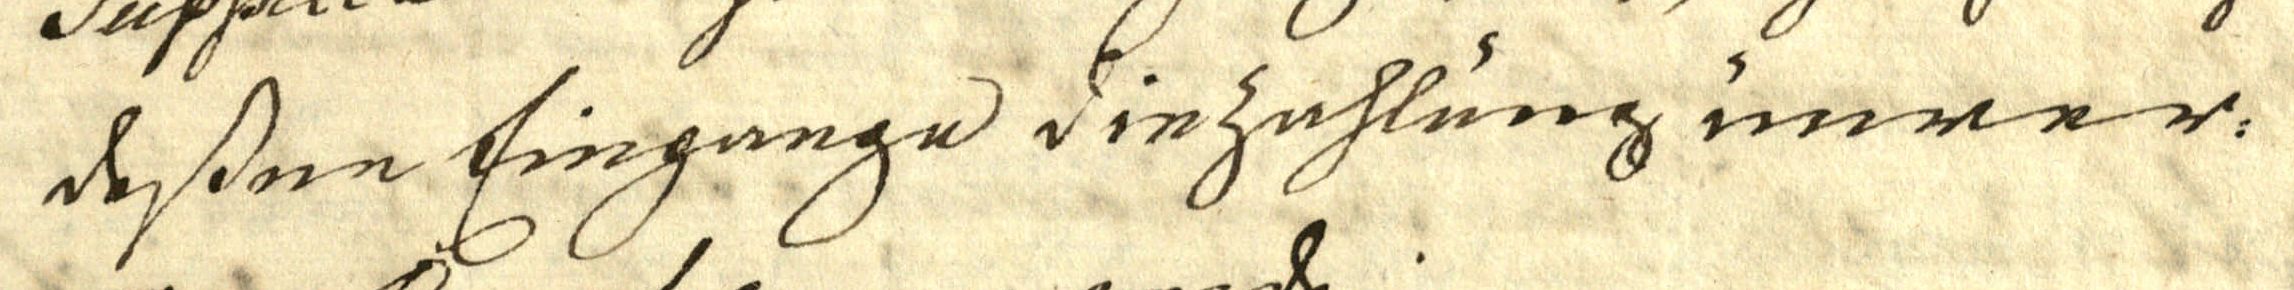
deßen Eingang die Zahlung unver¬
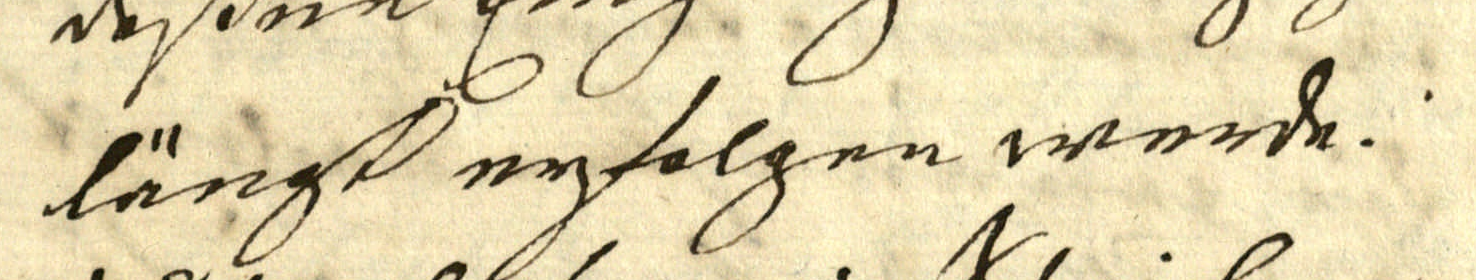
längt erfolgen werde.
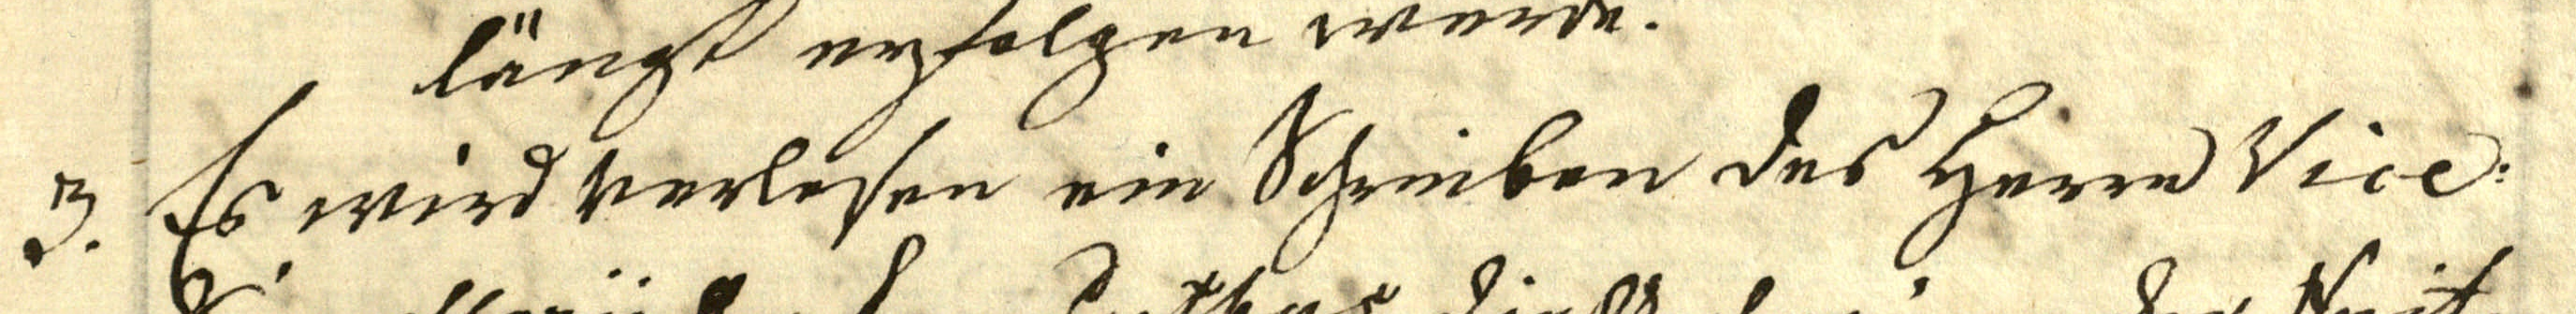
3. Es wird verlesen ein Schreiben des Herrn Vice-
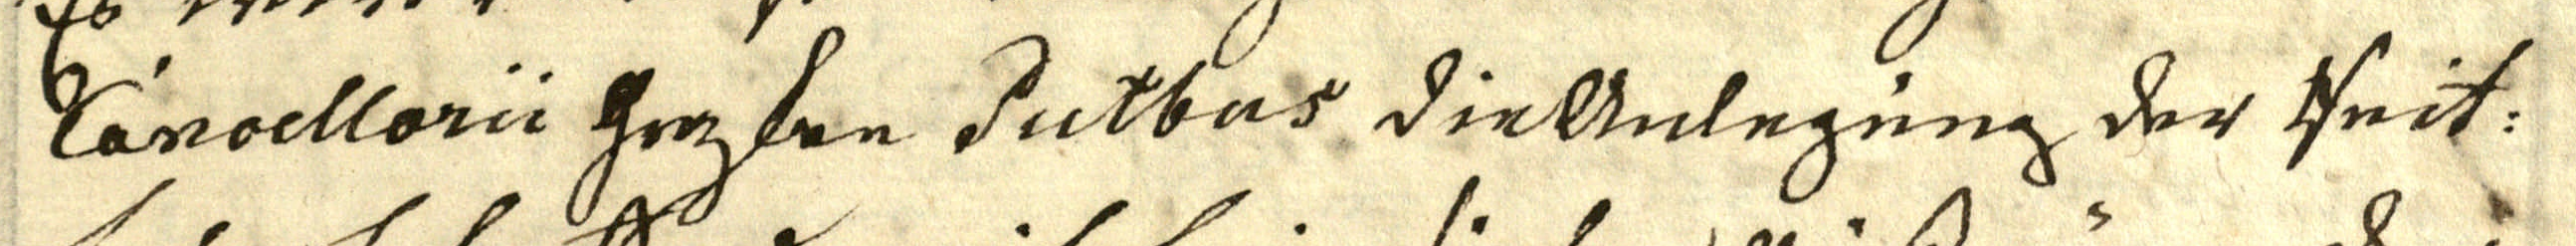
Cancellarii Grafen Putbus die Anlegung der Reit¬
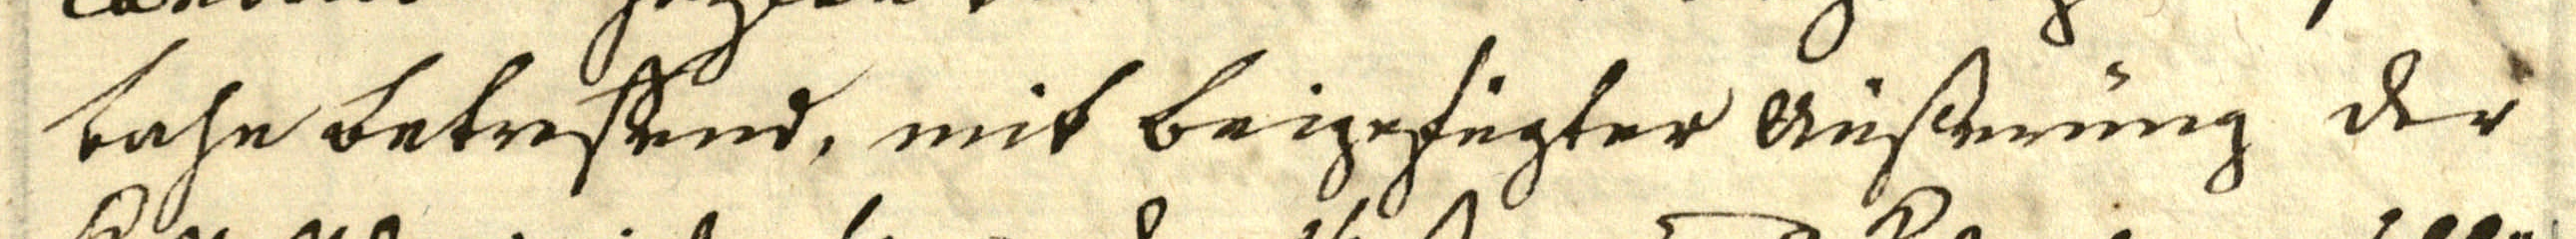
bahn betreffend, mit beigefügter Äußerung der
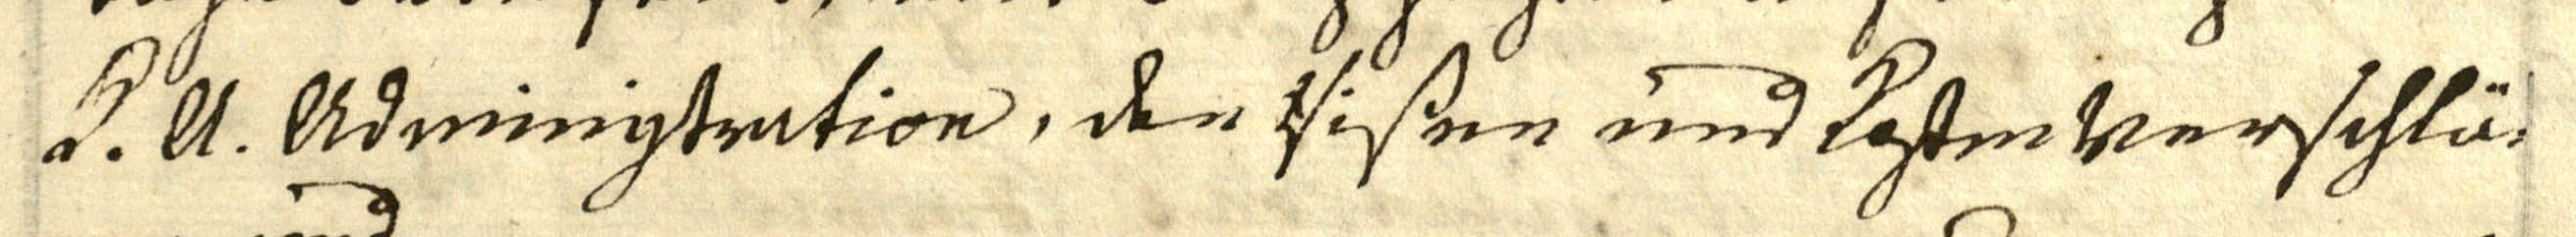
K.A. Administration, den Rißen und Kosten Verschlä¬
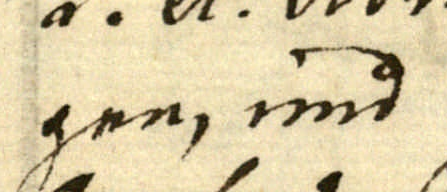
gen, und
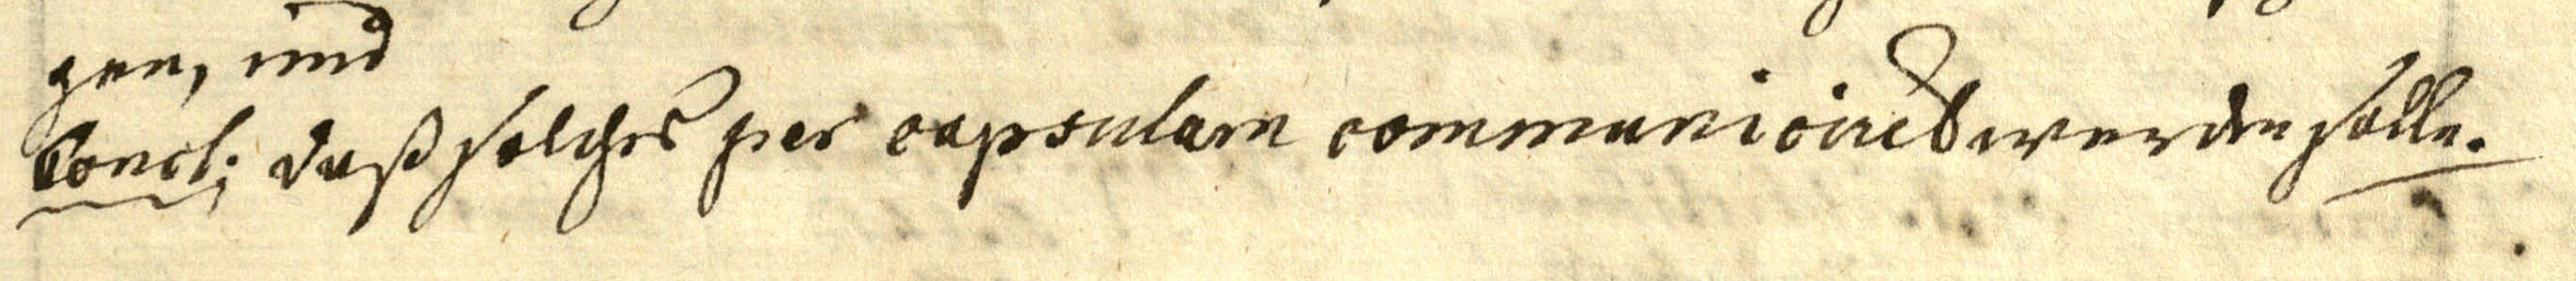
Concl. daß solches per Capsulam communiciret werden solle.
